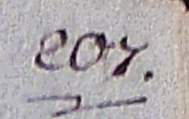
207.
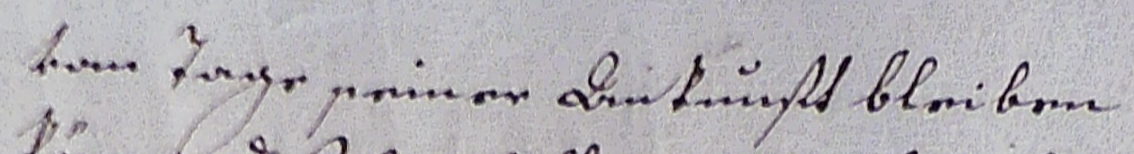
vom Tage seiner Ankunft bleiben
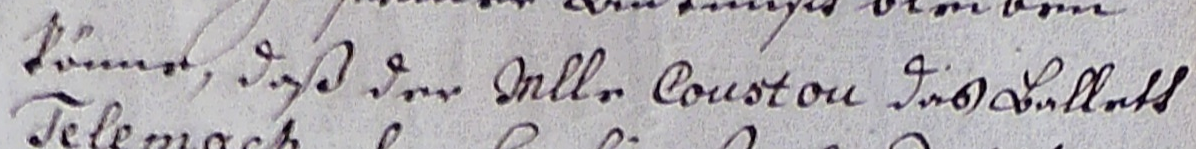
könne, daß der Mlle Coustou das Ballett
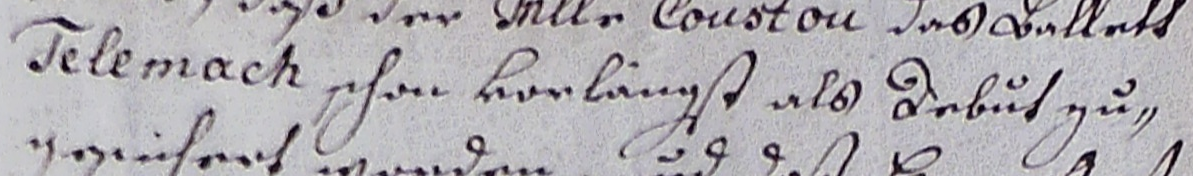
Telemack schon vorlängst als Debut zu¬
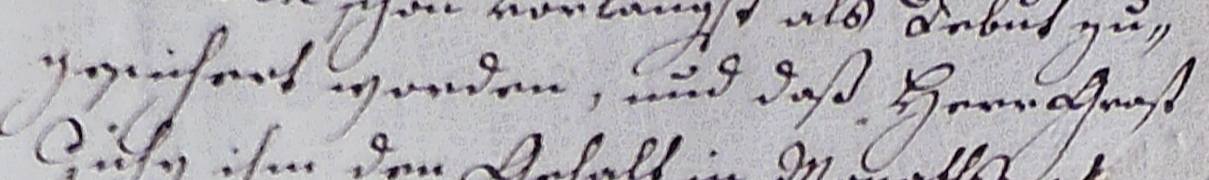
gesichert worden, und daß Herr Graf
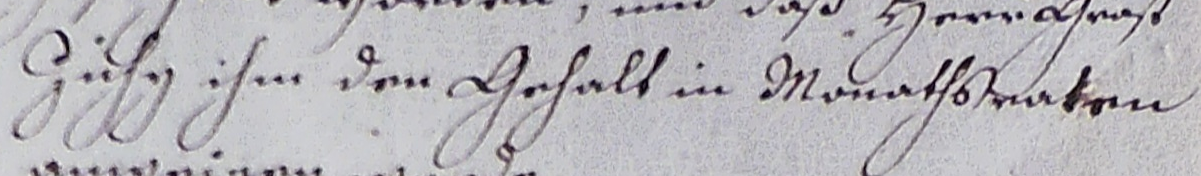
Zichy ihm den Gehalt in Monathsraten
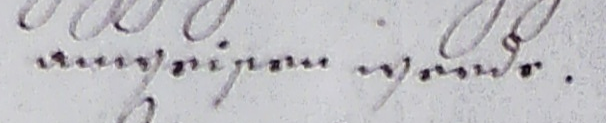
anweisen werde.
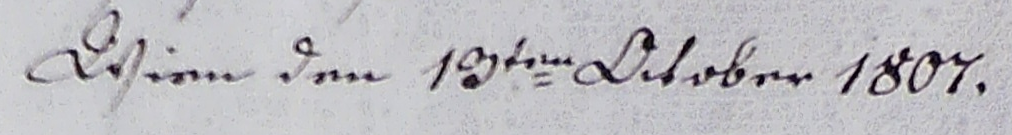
Wien den 13te͇n October 1807.
